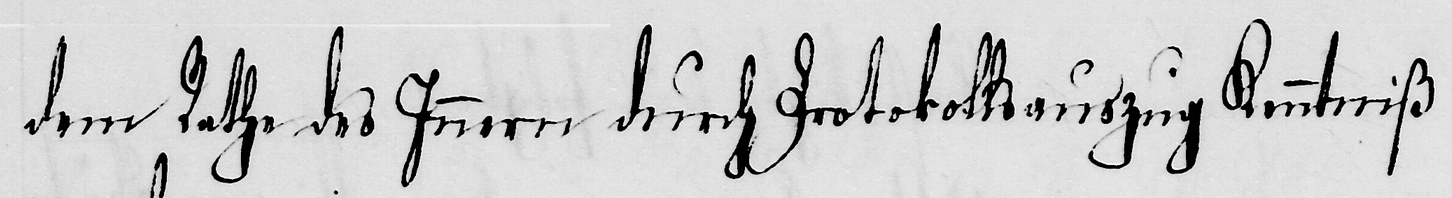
dem Rath des Innern durch Protokollsauszug Kenntniß
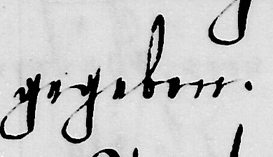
gegeben.
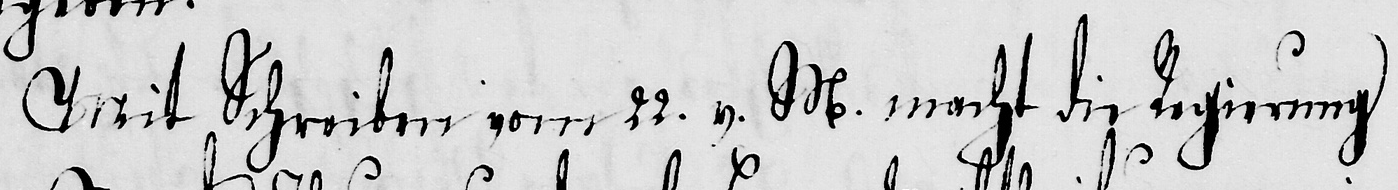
Mit Schreiben vom 22. v. M. macht die Regierung
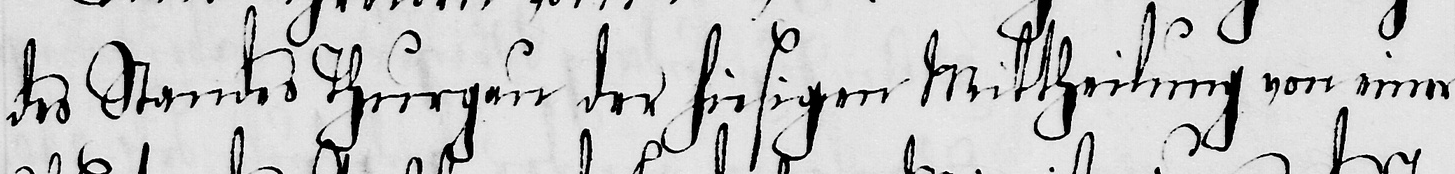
des Standes Thurgau der hiesigen Mittheilung von einer
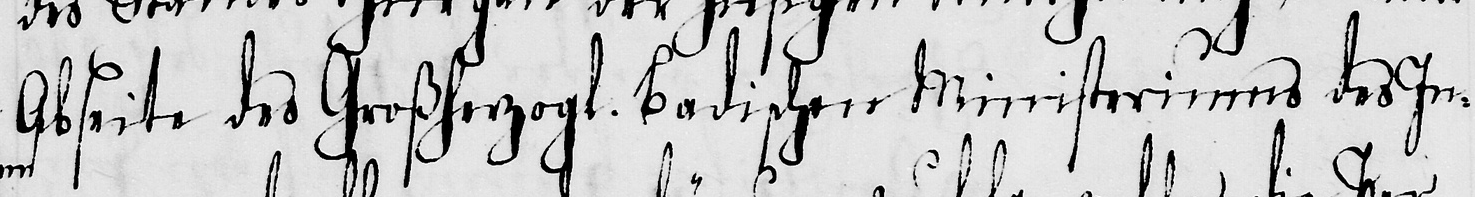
Abseite des Großherzogl. Badischen Ministeriums des In¬
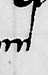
an
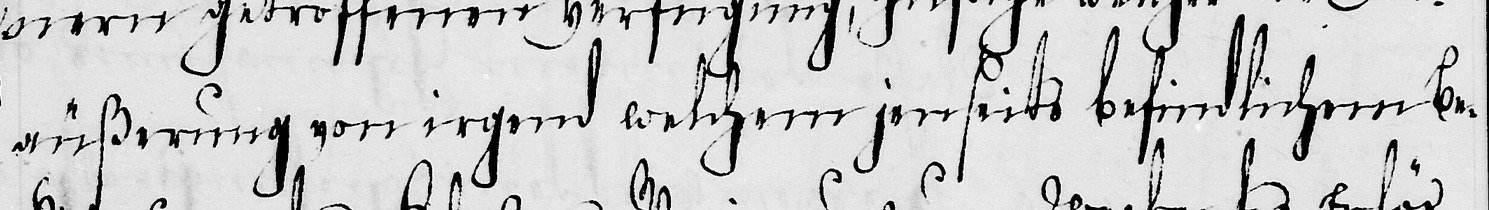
äußerung von irgend welchem jenseits befindlichem Be¬
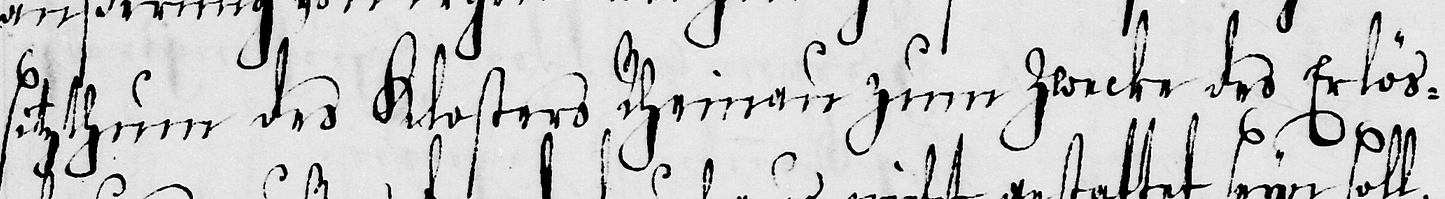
sitzthum des Klosters Rheinau zum Zwecke des Erlös¬
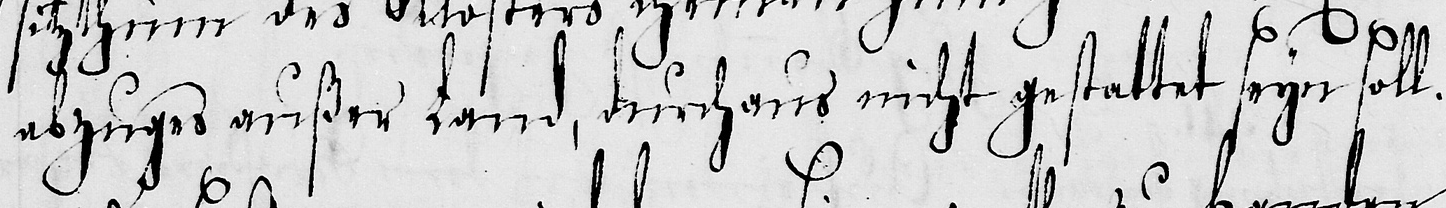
abzuges außer Land, durchaus nicht gestattet seyn soll.
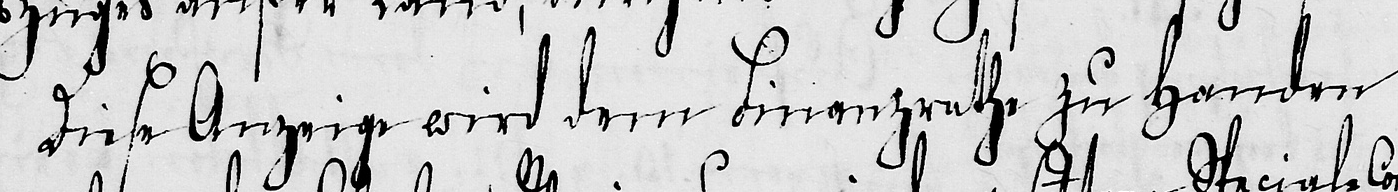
Diese Anzeige wird dem Finanzrathe zu Handen
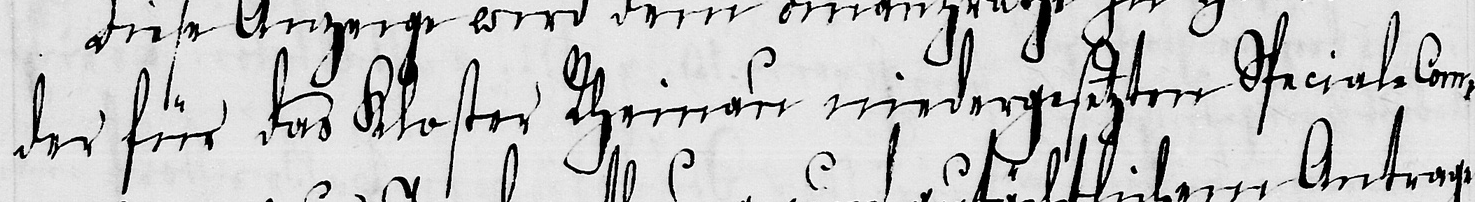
der für das Kloster Rheinau niedergesetzten Special-Co¬
